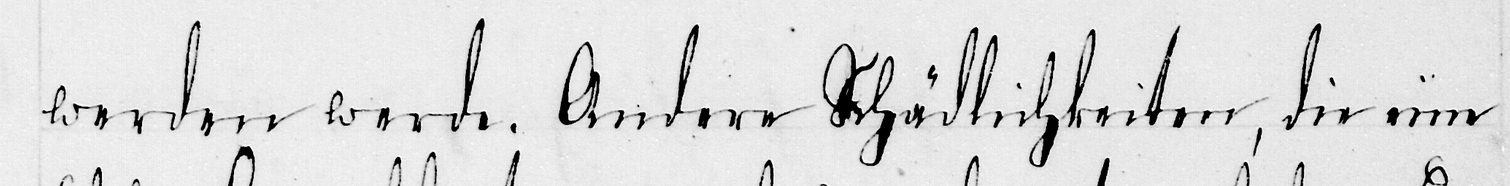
werden werde. Andere Schädlichkeiten, die eine
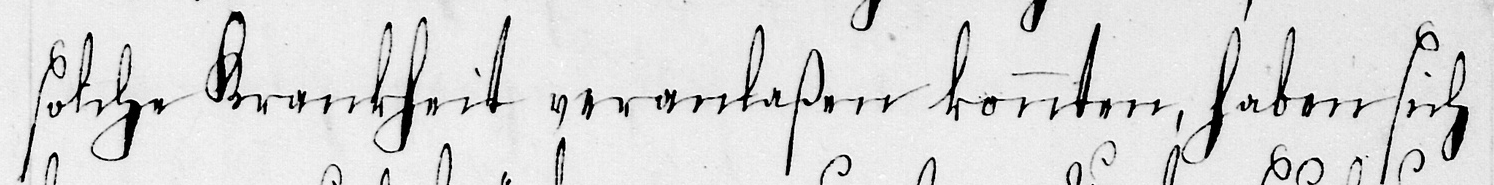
solche Krankheit veranlaßen könnten, haben sich
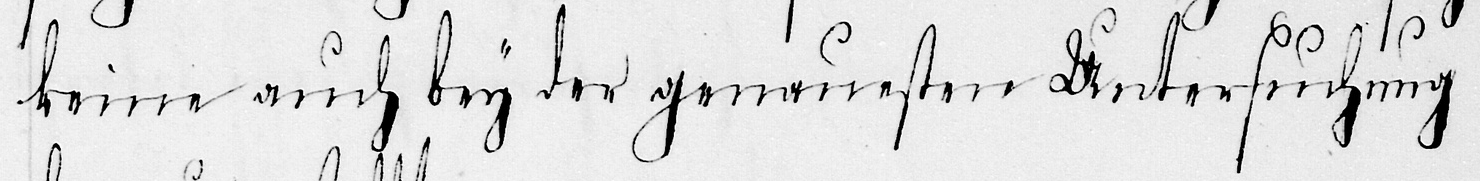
keine auch bey der genauesten Untersuchung
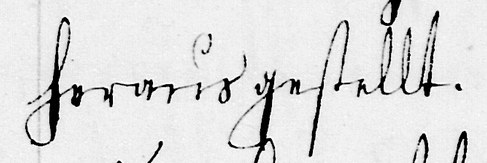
heraus gestellt.
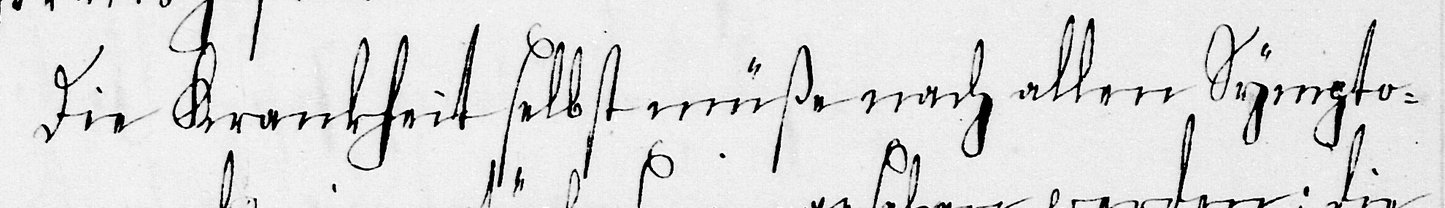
Die Krankheit selbst müße nach allen Sympto¬
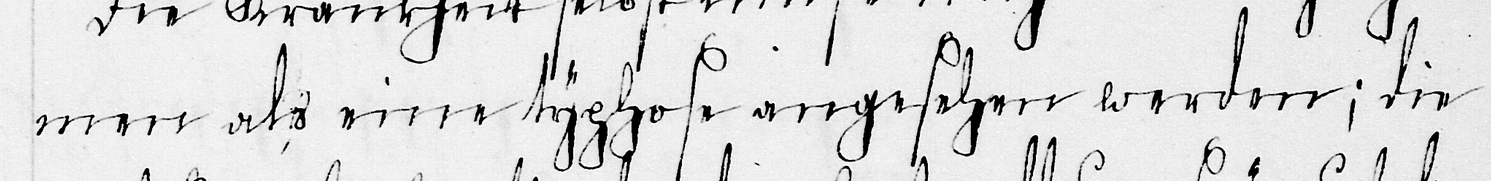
men als eine typhose angesehen werden; die
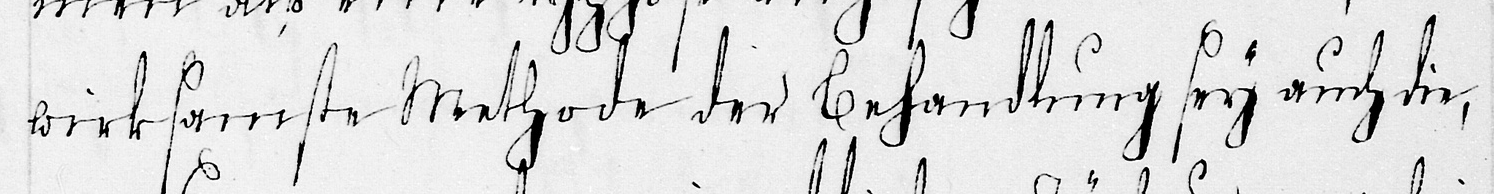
wirksamste Methode der Behandlung sey auch die,
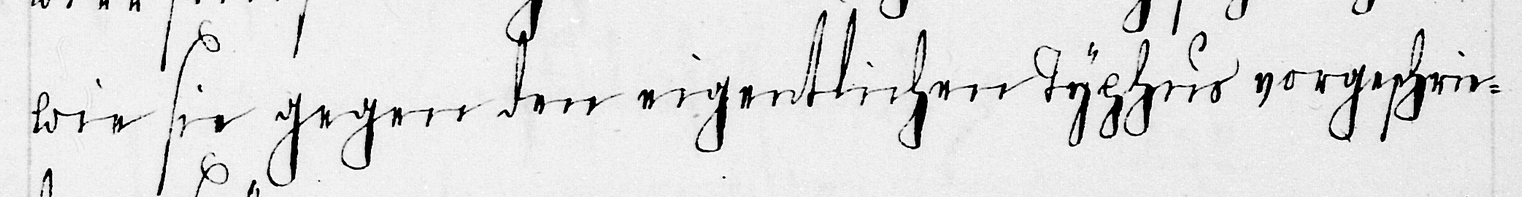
wie sie gegen den eigentlichen Typhus vorgeschrie¬
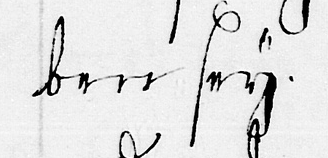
ben sey.
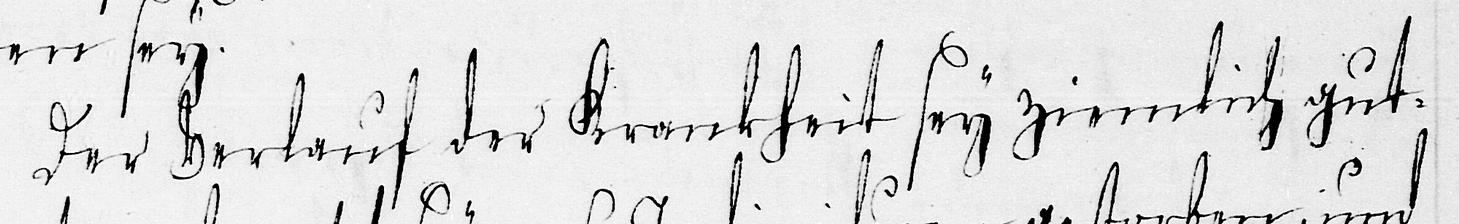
Der Verlauf der Krankheit sey ziemlich gut¬
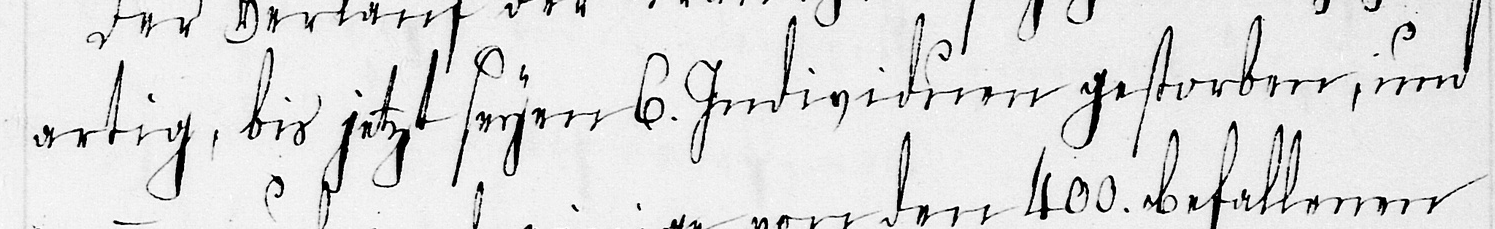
artig, bis jetzt seyen 6. Individuen gestorben, und
